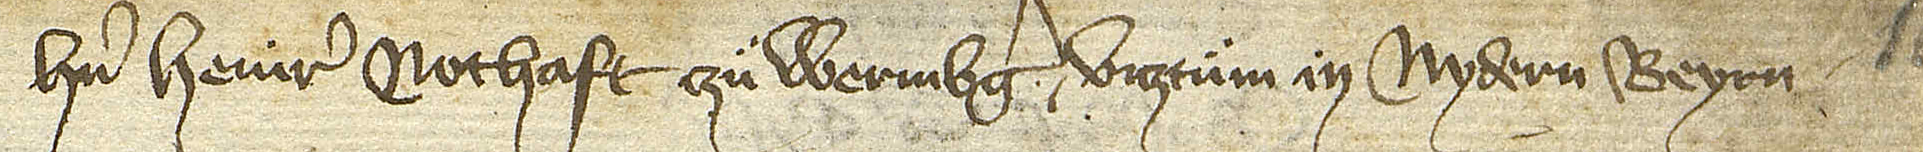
hn* heinr* Nothaft cʒü Wermbg* / Vicʒtüm in Nydern Beyrn /
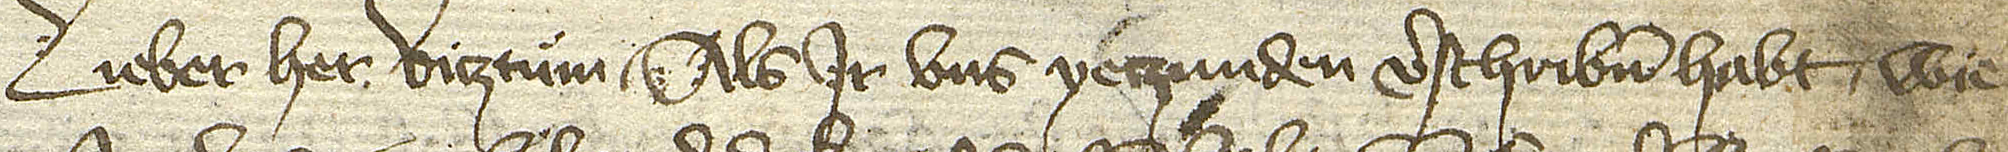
Lieber her Vicʒtüm / Als Ir vns yecʒunden v*ſchribn* habt / wie
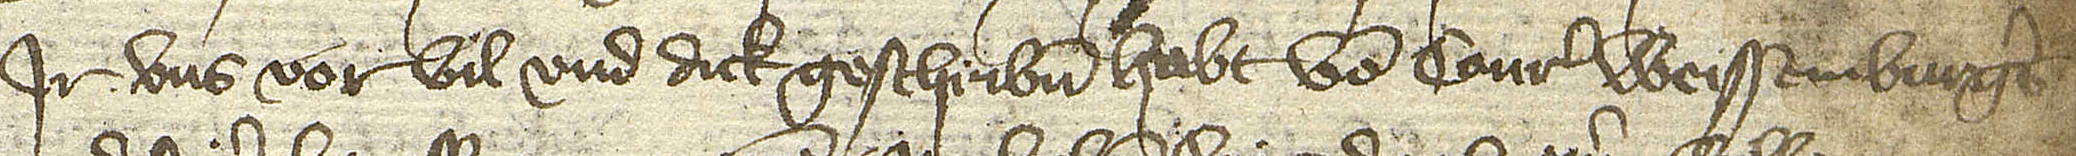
Ir vns vor vil vnd dick geſchribn* habt vo* Conr* Weiſſemburgs*
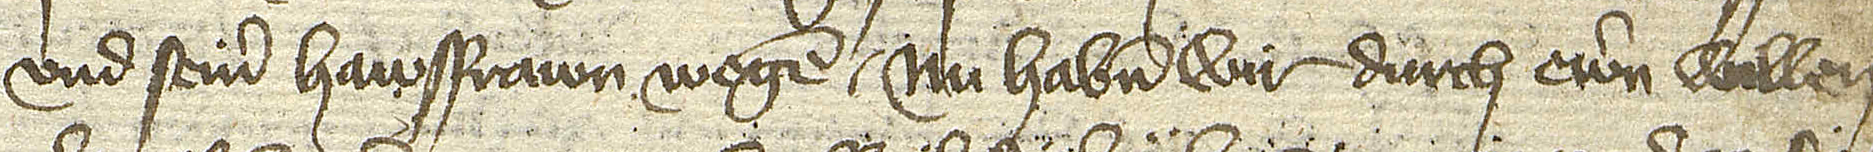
vnd ſein* hawſfrawn wege* / Nu habn* wir durch ewn* willen
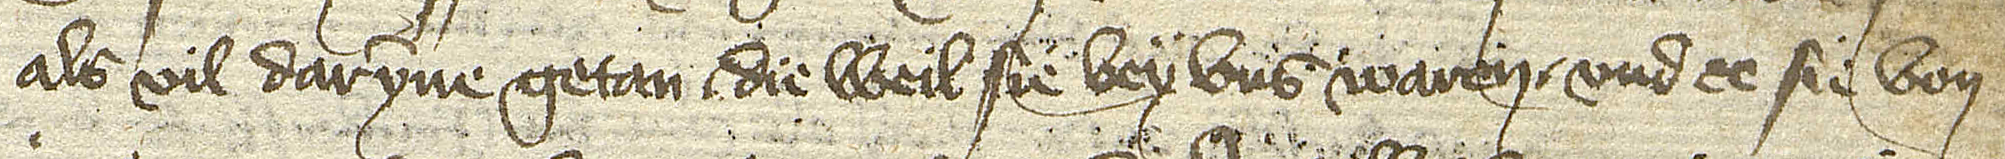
als vil dary*ne getan / die weil ſie bey vns waren / vnd ee ſie von
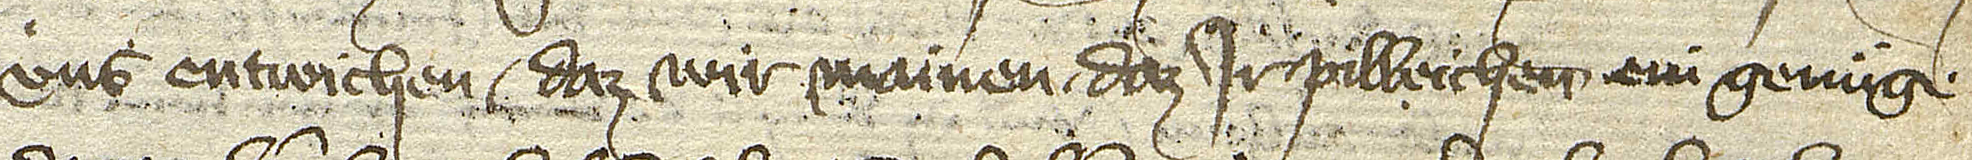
vns entwichen / daʒ wir mainen / daʒ Ir pilleichen ein genüge
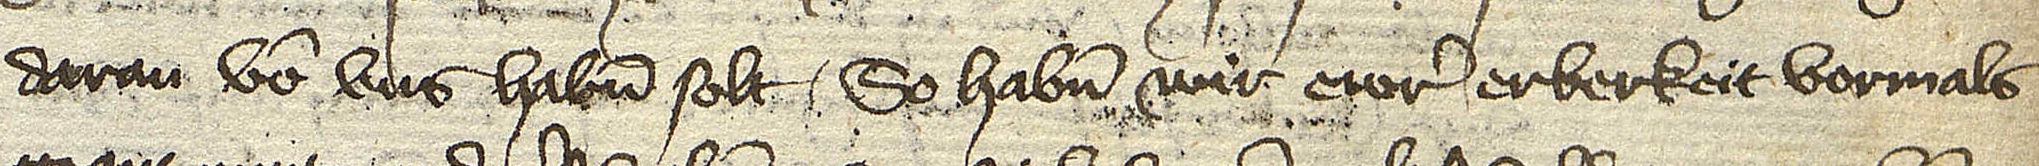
daran vo* vns habn* ſolt / So habn* wir ewr* erberkeit vormals
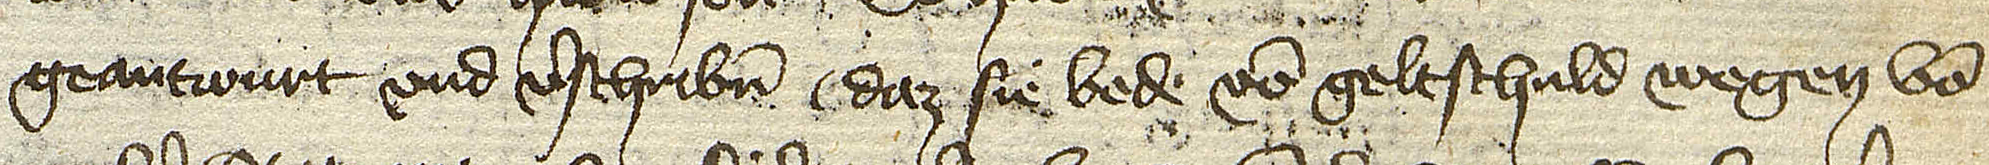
geantwurt vnd v*ſchribn* / daʒ ſie bede vo* geltſchuld wegen vo*
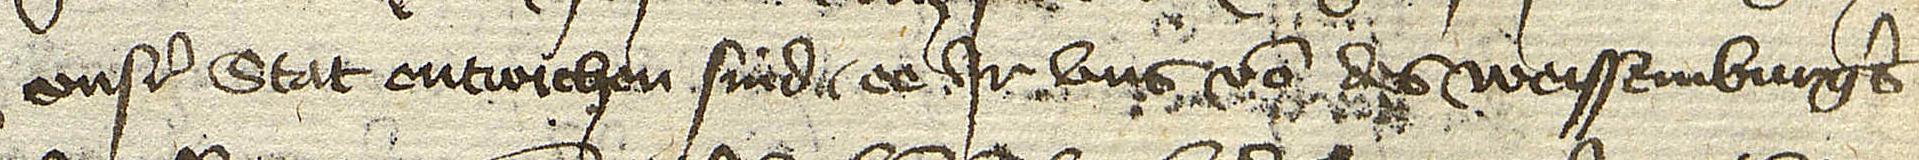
vnſr* Stat entwichen ſind / ee Ir vns vo* des weiſſemburg*s
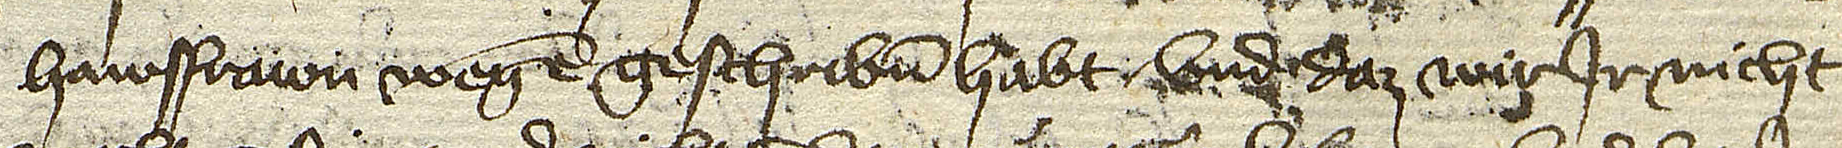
hawſfrawn wege* geſchribn* habt / vnd daʒ wir Ir nicht
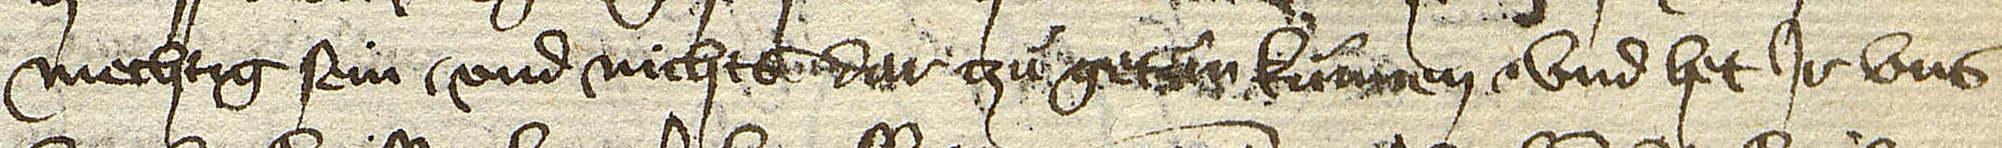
mechtig ſein / vnd nichts dar cʒü getün künnen / vnd het Ir vns
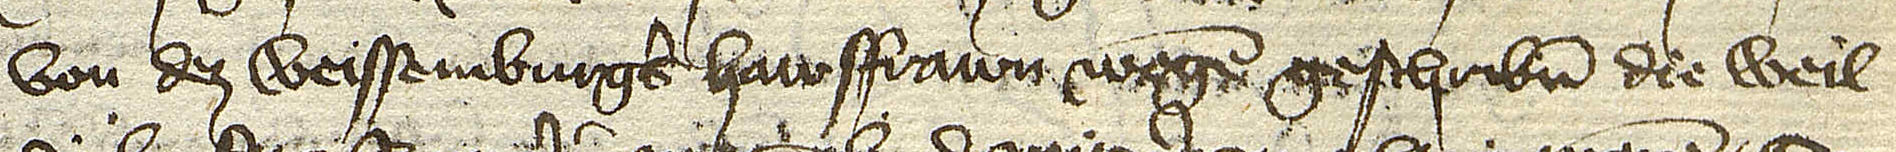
von deʒ weiſſemburg*s hawſfrawn wege* geſchribn* die weil
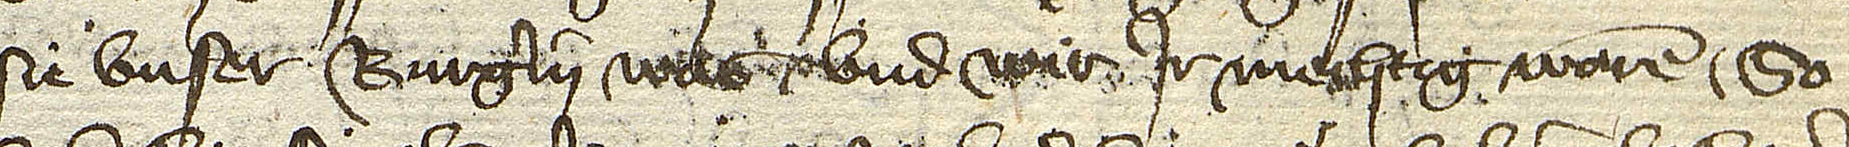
ſie vnſer Burg*in was / vnd wir Ir mechtig ware* / So
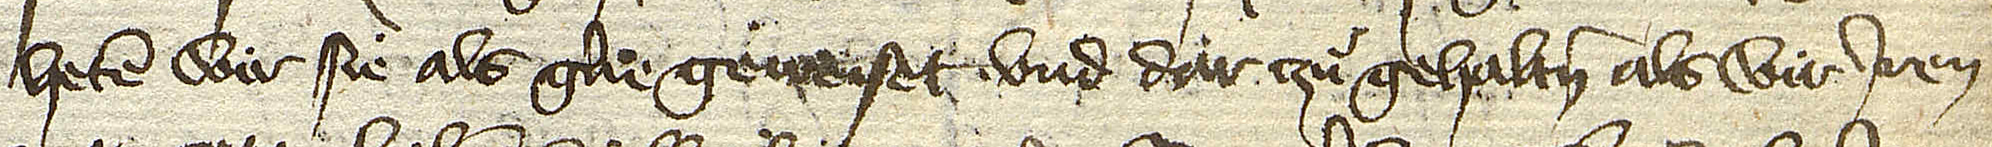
hete* wir ſie als g*ne geweiſet . vnd dar cʒü gehaltn* als wir Irem
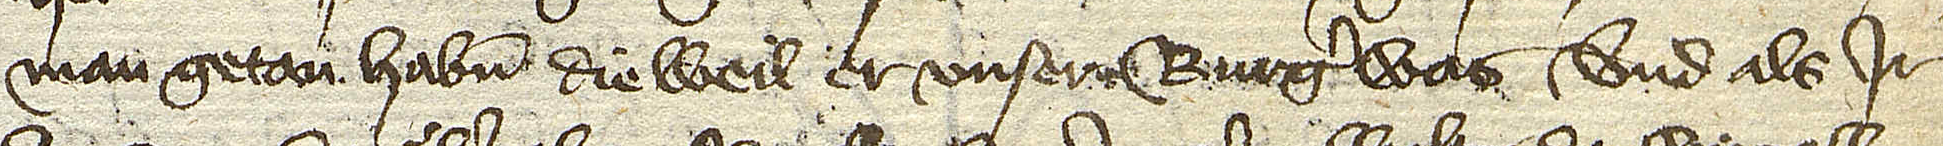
man getan habn* die weil er vnſer Burg* was / Vnd als Ir
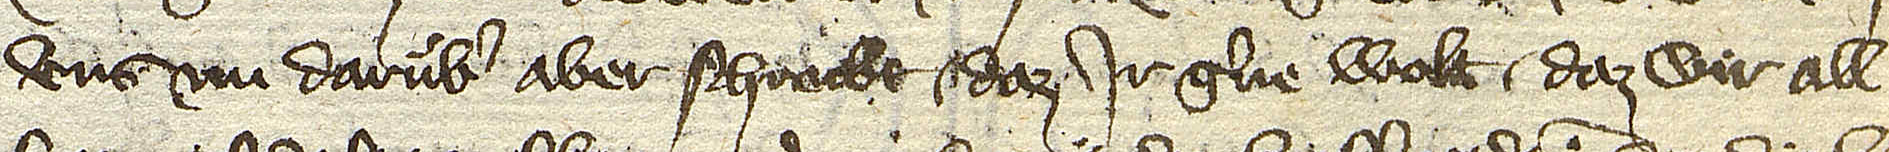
vns nu darüb* aber ſchreibt / daʒ Ir g*ne wolt / daʒ wir all
